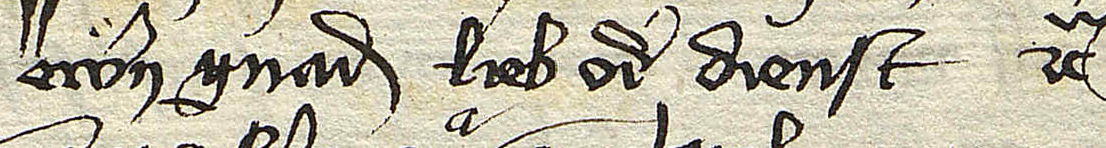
ew*n gnad* lieb od* dienſt ec*
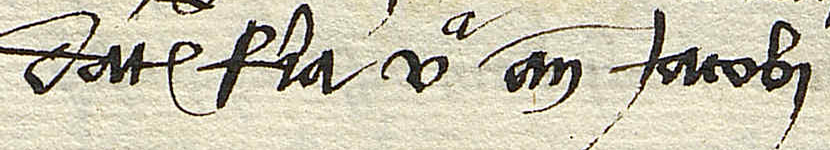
Dat* fia* v* an* Iacobi
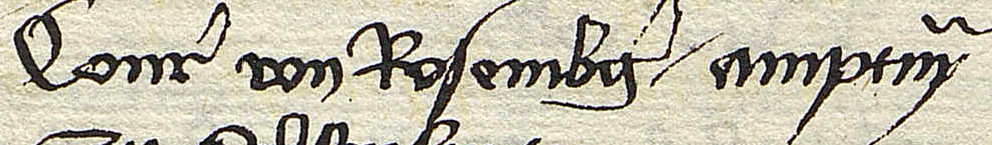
Conr* von Roſemb*g / amptm*
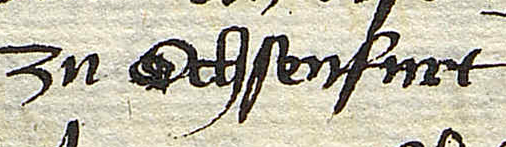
ʒu Ochſenfurt
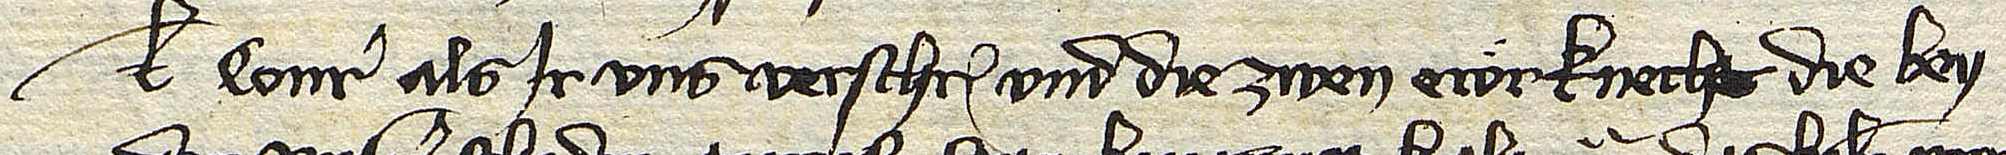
L* Conr* als Ir vns verſchr* vnd die ʒwen ewr knecht die bey
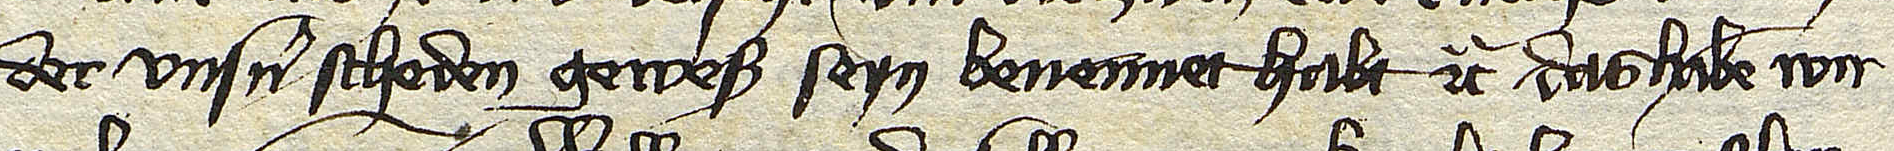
der vnſ*n ſcheden geweſ* ſeyn benennet habt ec* / das habe* wir
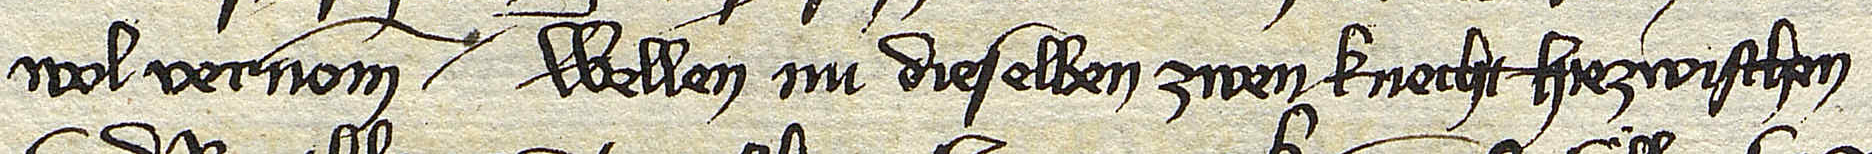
wol vernom* / Wellen nu dieſelben ʒwen knecht hieʒwiſchen
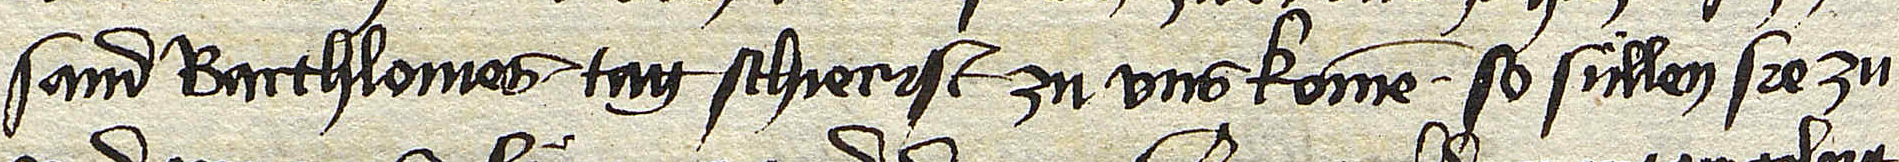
ſand Barthlomes tag ſchieriſt ʒu vns kome* . ſo ſüllen ſie ʒu
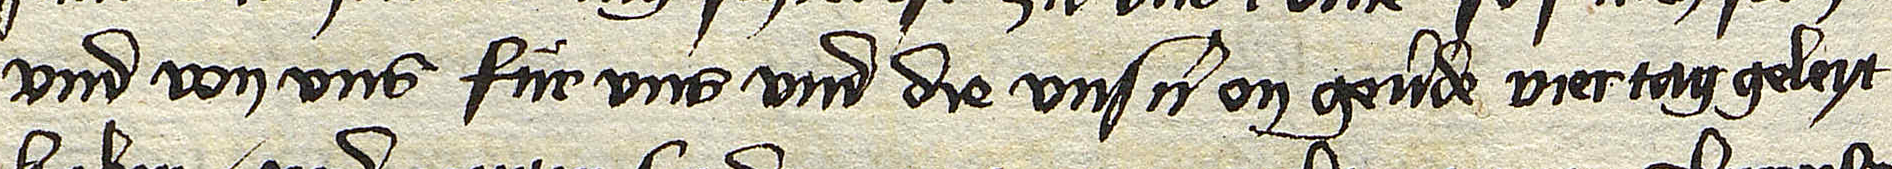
vnd von vns für vns vnd die vnſ*n on geu*de vier tag geleyt
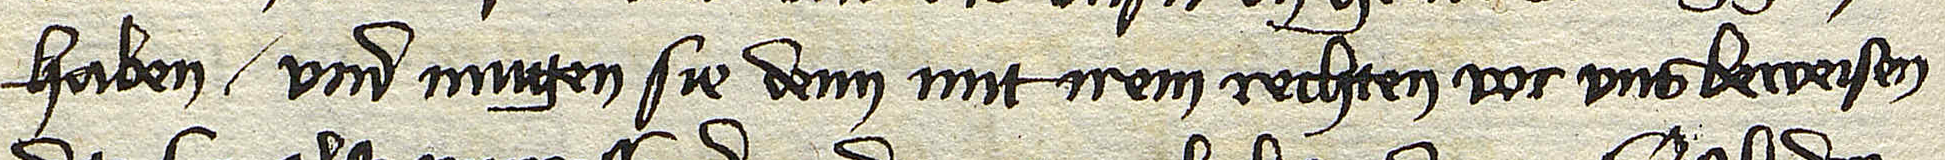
haben / vnd mugen ſie denn mit irem rechten vor vns beweiſen
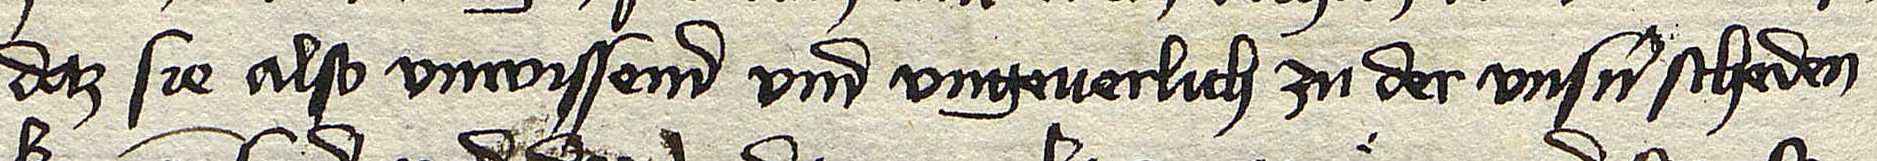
daʒ ſie alſo vnwiſſend vnd vngeuerlich ʒu der vnſ*n ſcheden
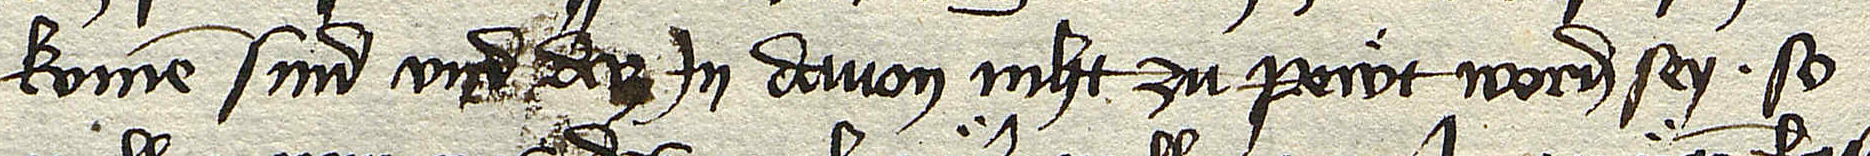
kome* ſind vnd daʒ In dauon niht ʒu Pewt word* ſey . ſo
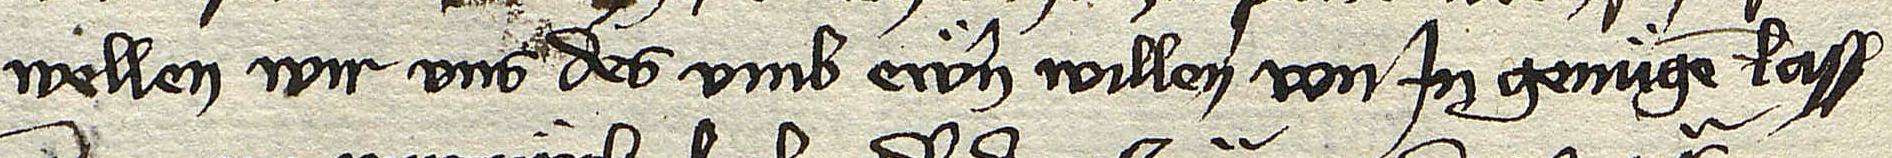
wellen wir vns des vmb ew*n willen von In genüge* laſſ*
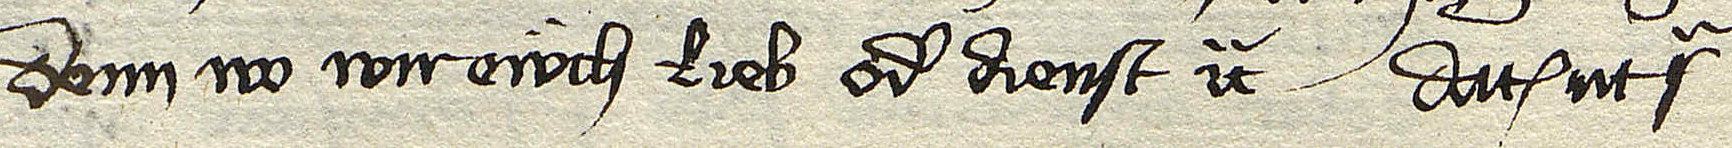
Denn wo wir ewch lieb od* dienſt ec* Dat ut ſ*
